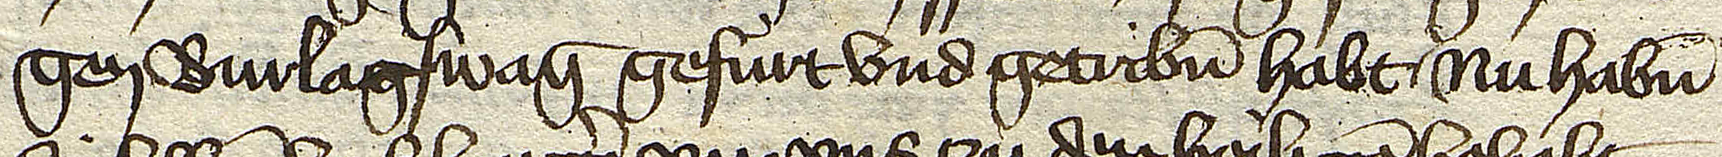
gen Burglagſwag gefürt vnd getribn* habt / Nu habn*
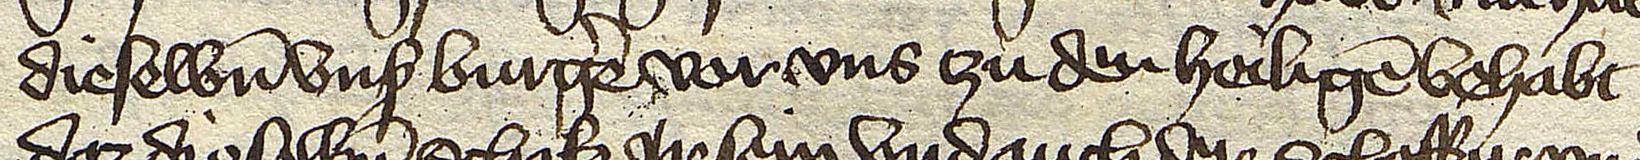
dieſelbn* vnſ* burge* vor vns cʒu den heilige* behabt*
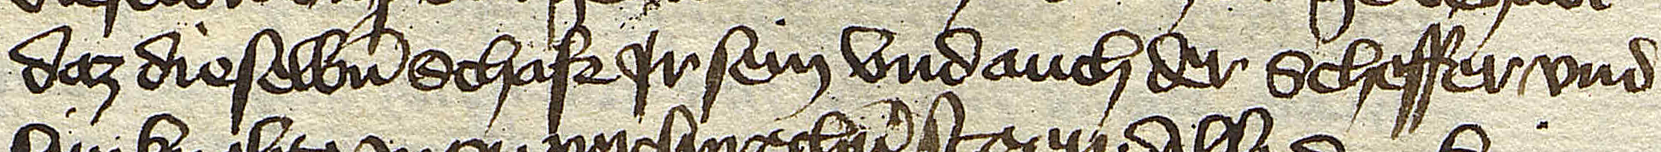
daʒ dieſelbn* Schafe Ir ſein vnd auch der Scheffer vnd
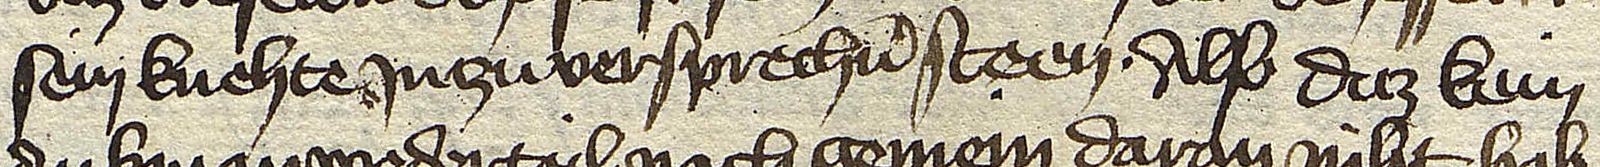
ſein knehte In cʒu verſprechn* ſteen . Alſo daʒ kein
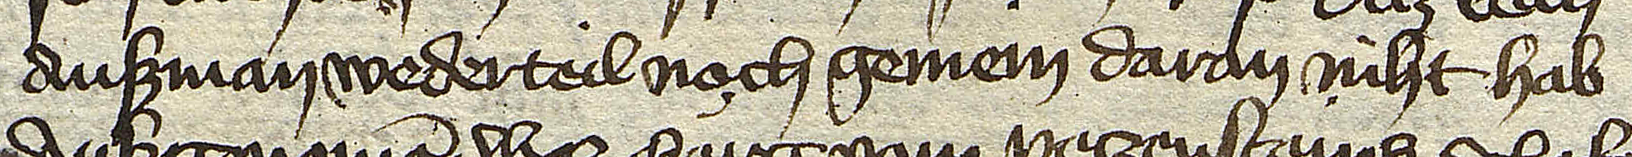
Auſʒman wederteil noch gemein daran niht hab
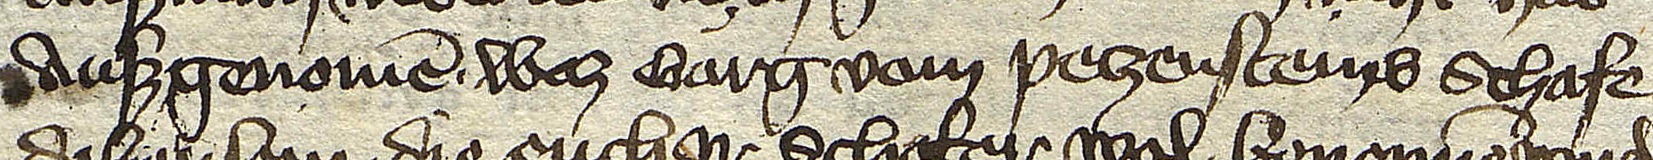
Auſʒgenome* . waʒ Görg vom pecʒenſteins Schafe
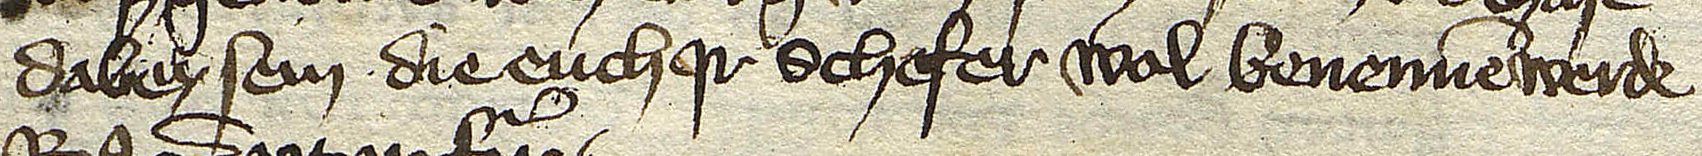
dabey ſein . die euch Ir Schefer wol benenne* werde
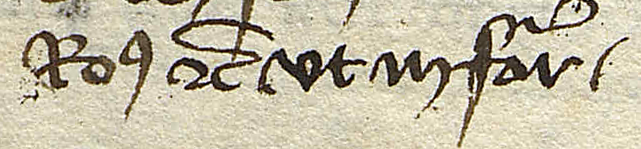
Rog* ec* vt in for* /
